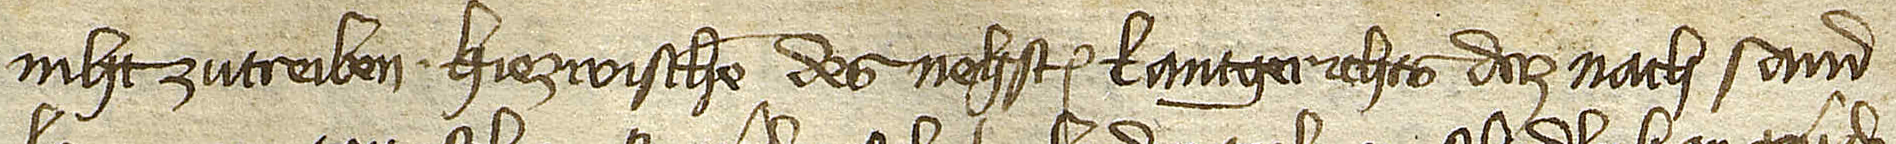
niht ʒutreiben . hieʒwiſche* des nehſt lantgerichts daʒ nach ſand
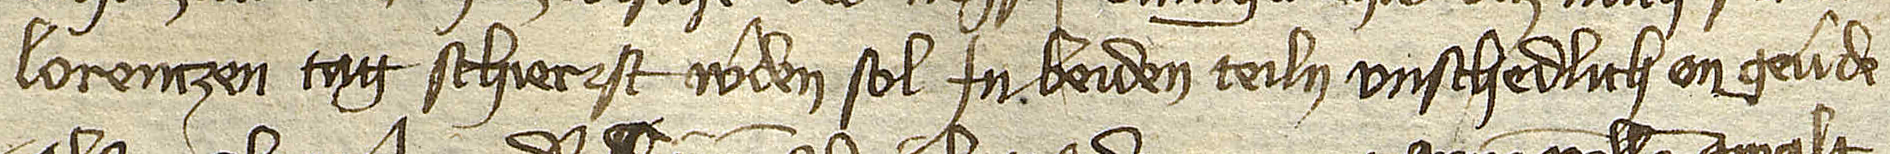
lorencʒen tag ſchieriſt w*den ſol In beiden teiln vnſchedlich on geu*de
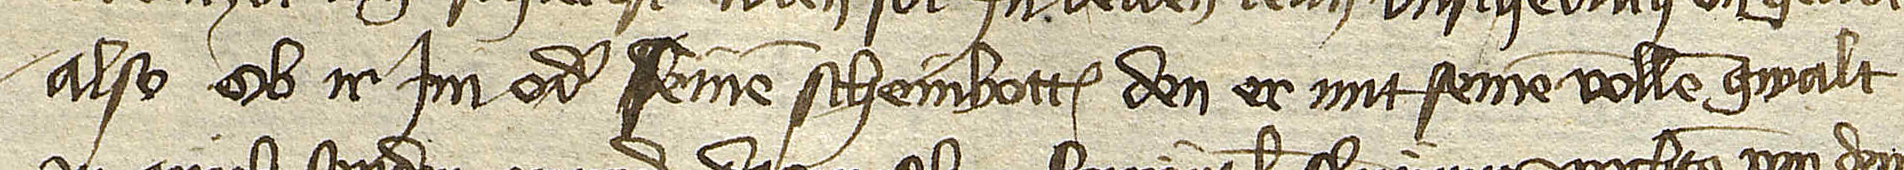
Alſo Ob ir Im od* ſeine* ſcheinbott* den er mit ſeine* volle* gwalt
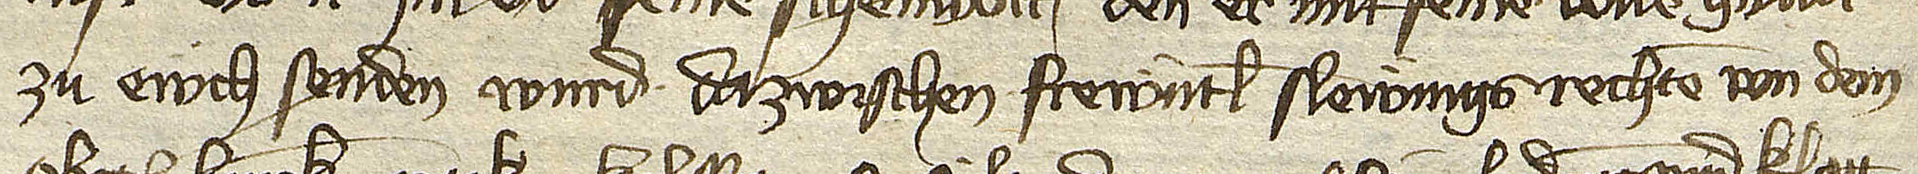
ʒu ewch ſenden wurd . daʒwischen frewntl* ſlewnigs rechte* von dem
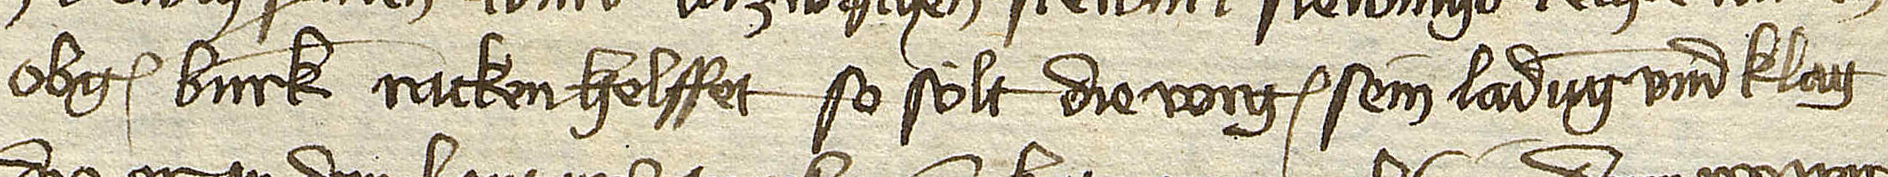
obg* burk* racken helffet ſo ſölt die vorg* ſein ladu*g vnd klag
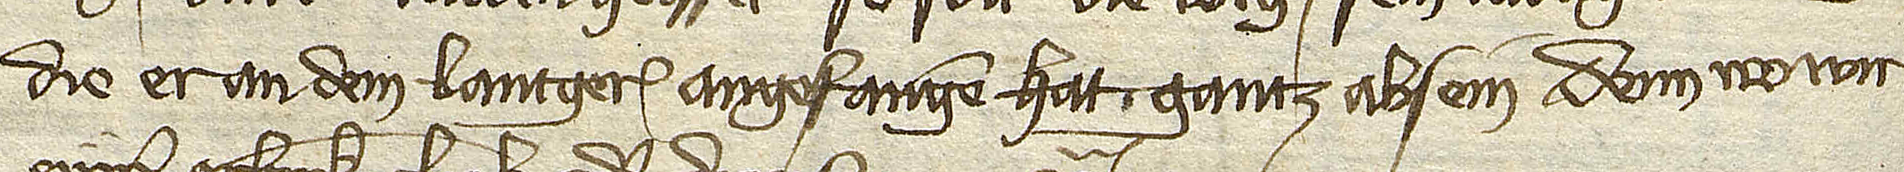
die er an dem lantger* angefange* hat . gancʒ abſein / Denn wo wir
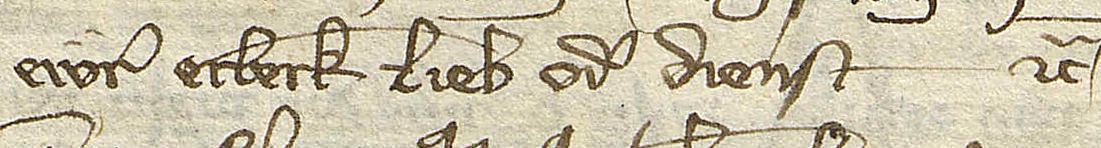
ew*r erberk* lieb od* dienſt ec*
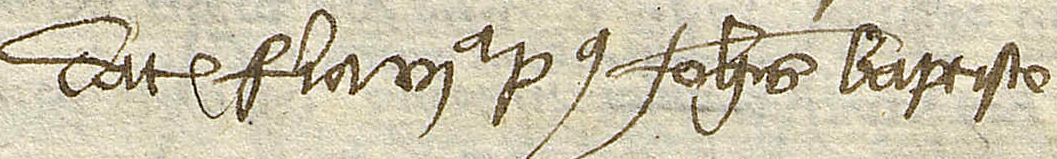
Dat* fia* vi* p* Ioh*s baptiſte
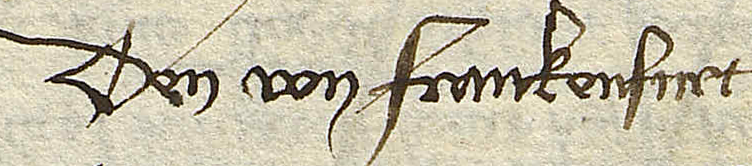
Den von Frankenfurt
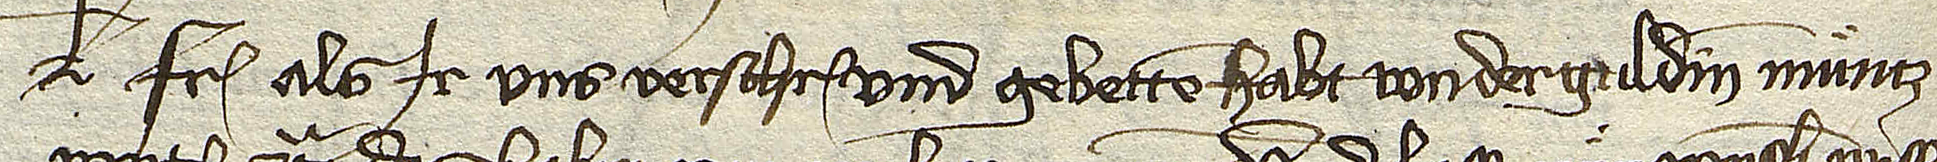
L* fr* als Ir vns verſchr* vnd gebette* habt von der guldin* müncʒ
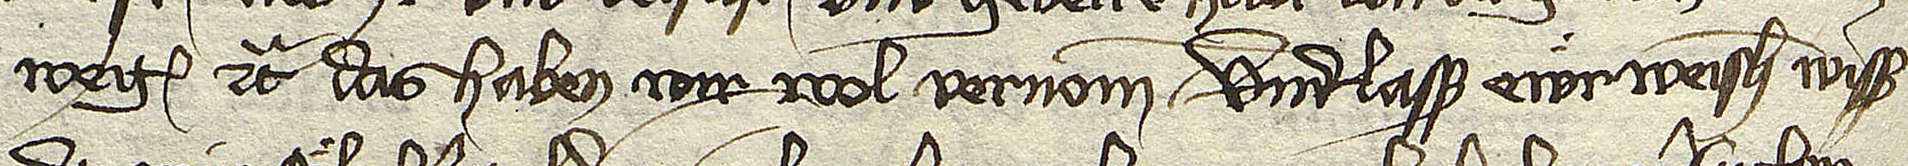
weg* ec* das haben wir wol vernom* / Vnd laſſ* ewr weiſh* wiſſ*
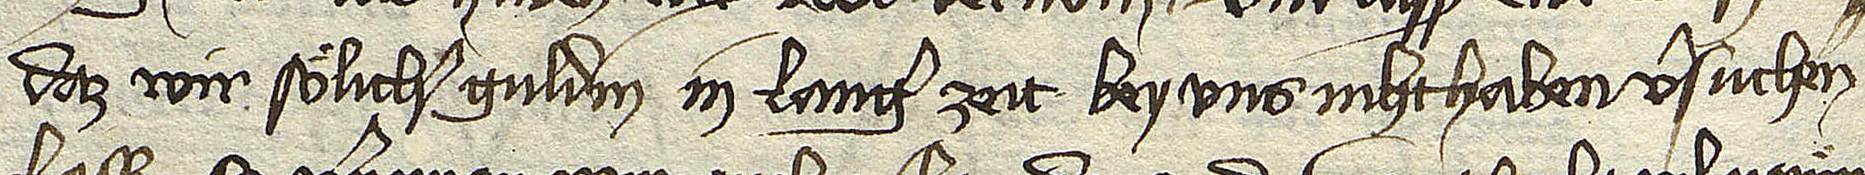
daʒ wir ſölich* guldin* in lang* ʒeit bey vns niht haben v*ſuchen
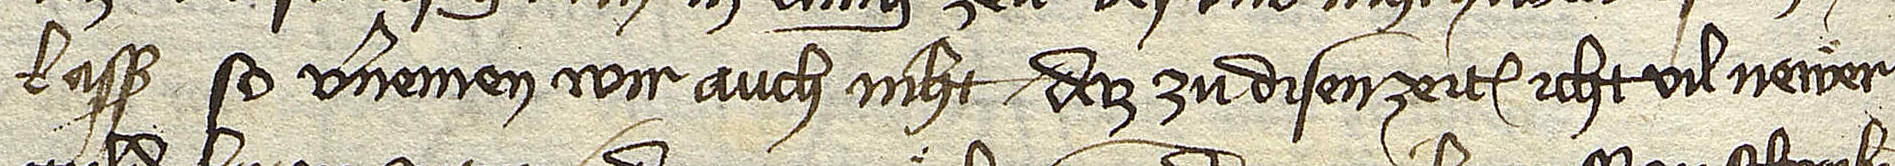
laſſ* ſo v*nemen wir auch niht / daʒ ʒu diſen ʒeit* icht vil newer
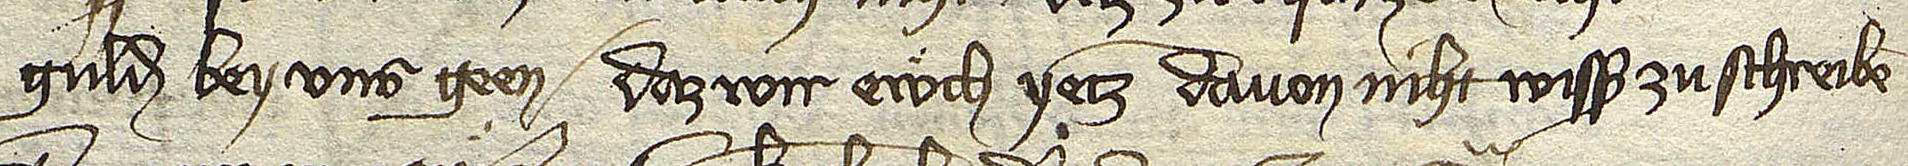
guld* bey vns geen / daʒ wir ewch yecʒ* dauon niht wiſſ* ʒu ſchreibe*
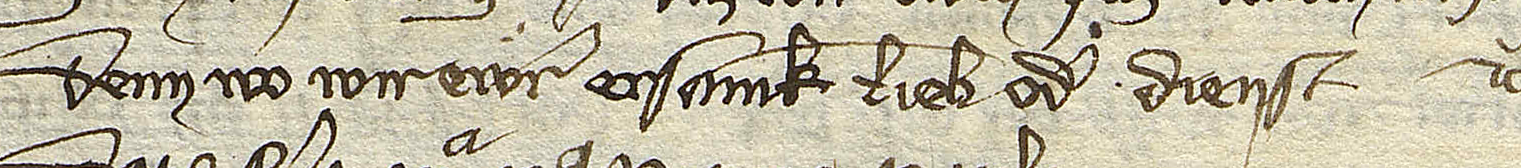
Denn wo wir ew*r erſamk* lieb od* dienſt ec*
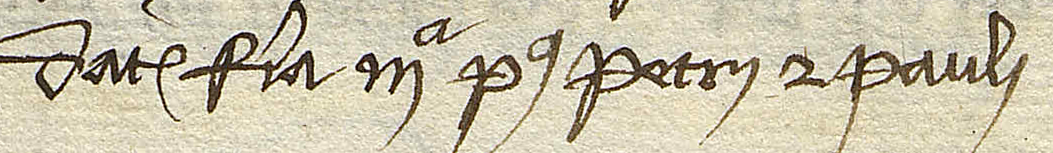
Dat* fia* iii* p* Petri @ Pauli
